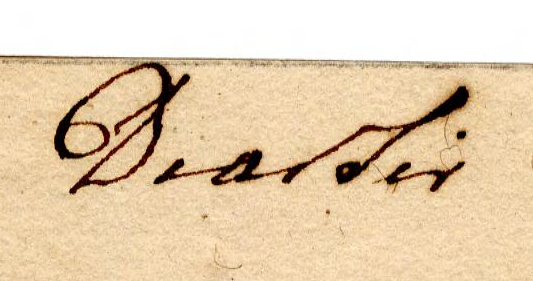Dear Sir
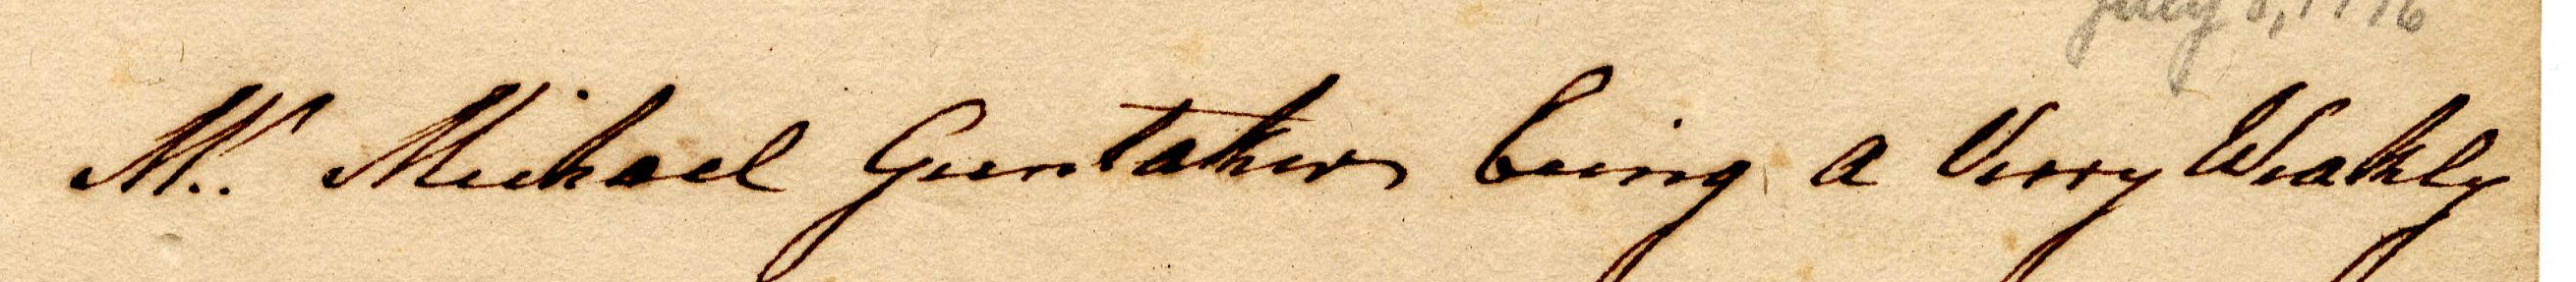M^r. Michael Gentaker being a Very Weakly
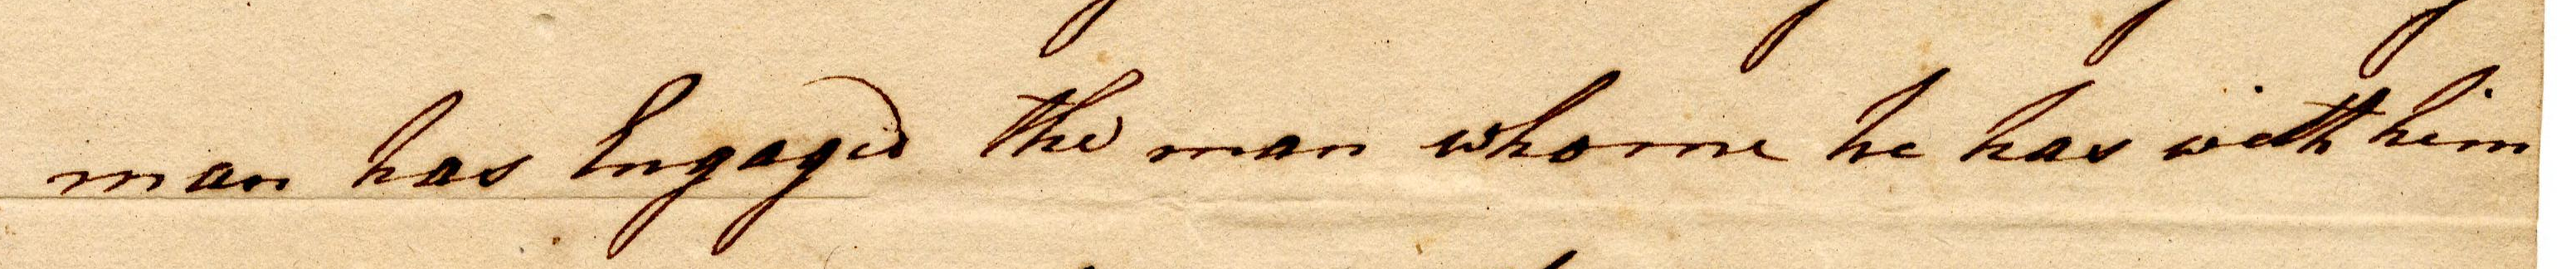man has Engaged the man whom he has with him
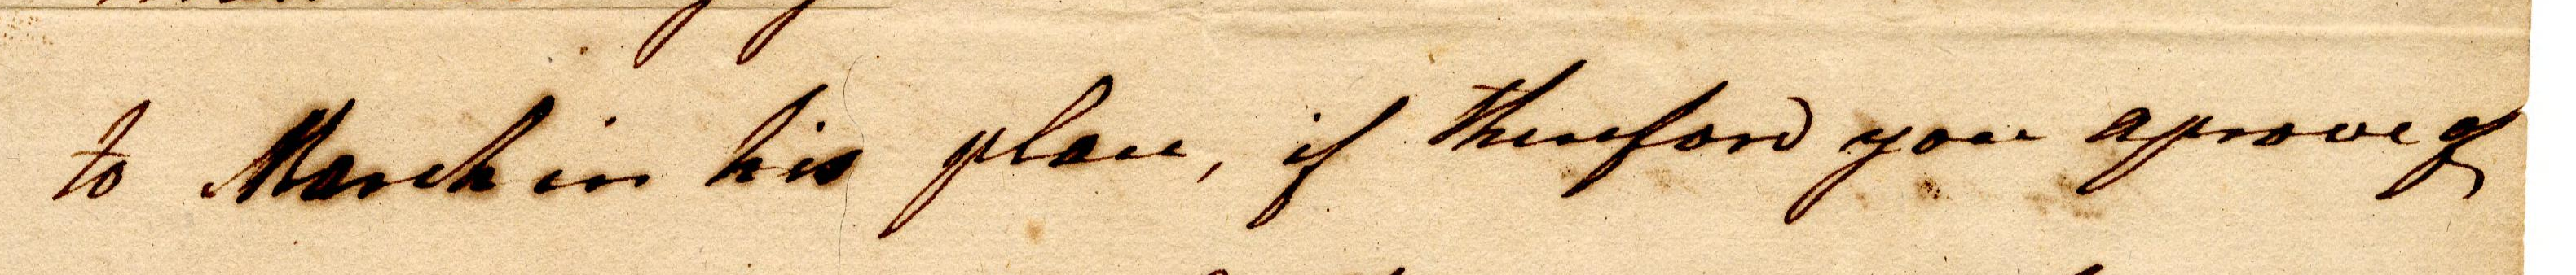to March in his place, if therefore you approve of
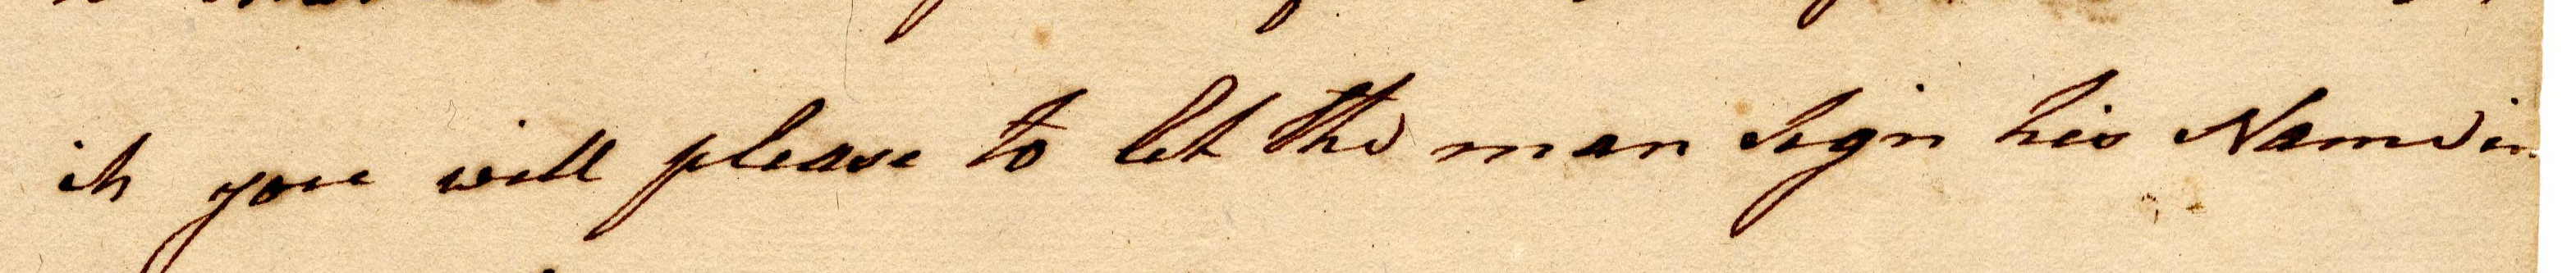it you will please to let the man sign his Name in
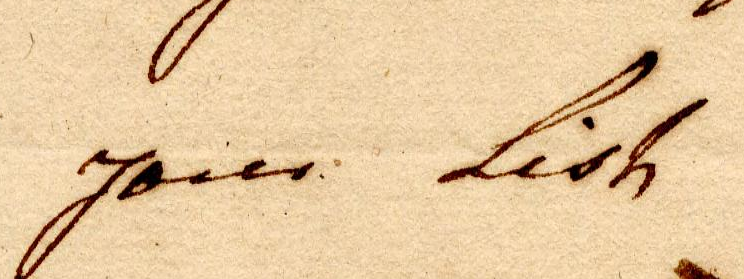your List
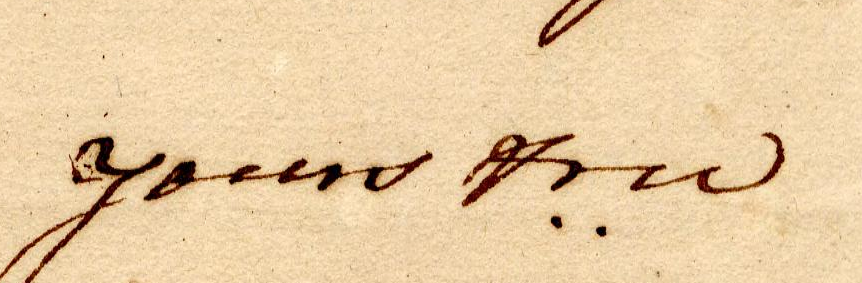yours &tc
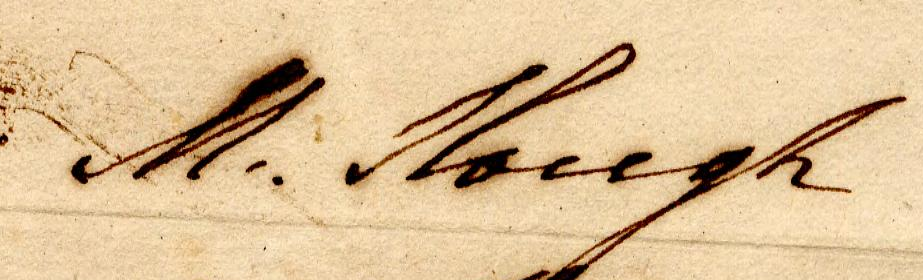M^r. Hough
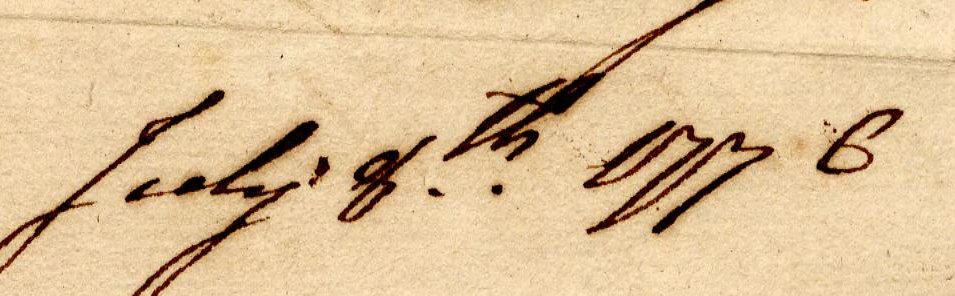July 8^th. 1776
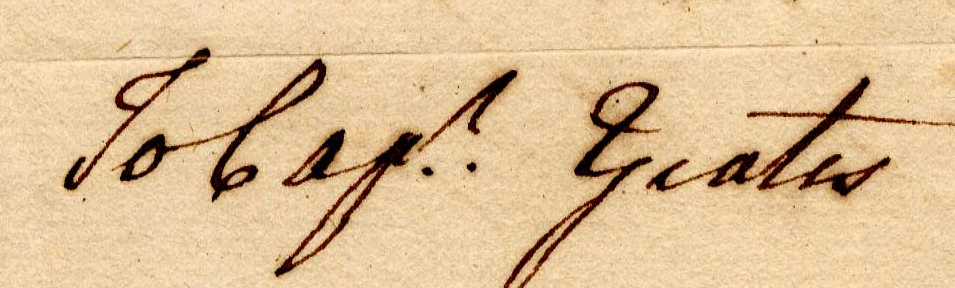To Cap^t. Yeates
